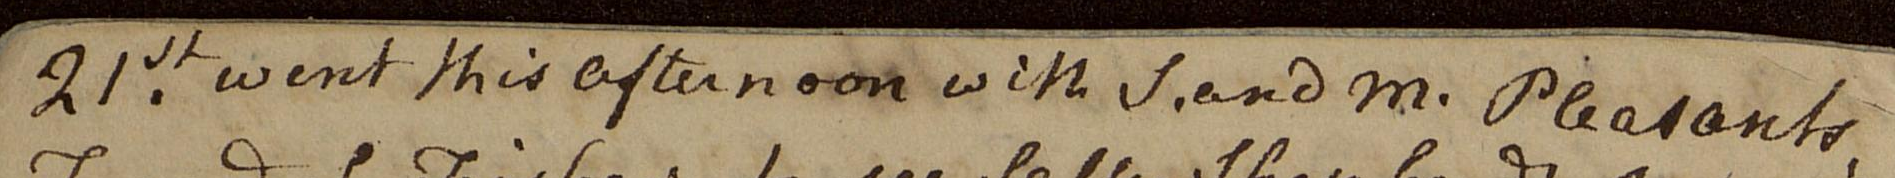21^st. went this afternoon with S, and M. Pleasants,
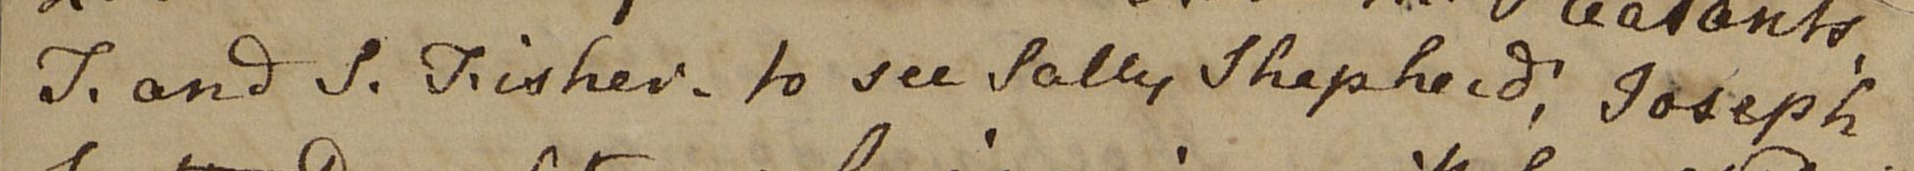T. and S. Fisher. to see Sally Shepherd, Joseph
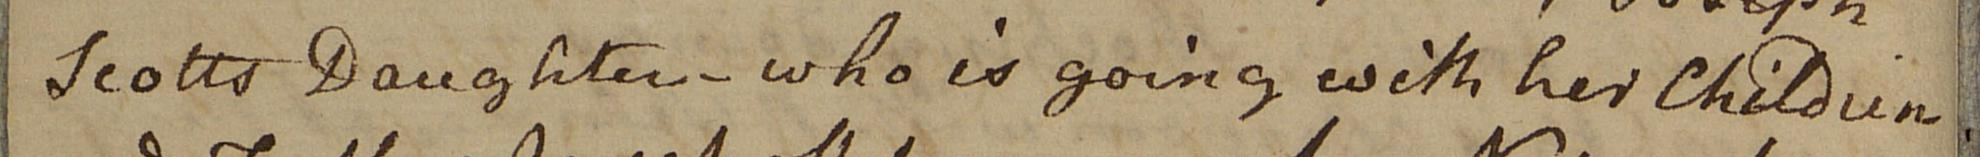Scotts Daughter- who is going with her Childrin
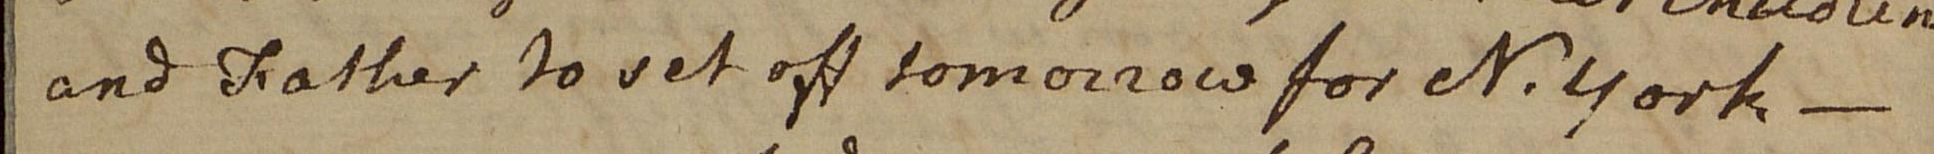and Father to set off tomorrow for N. York-
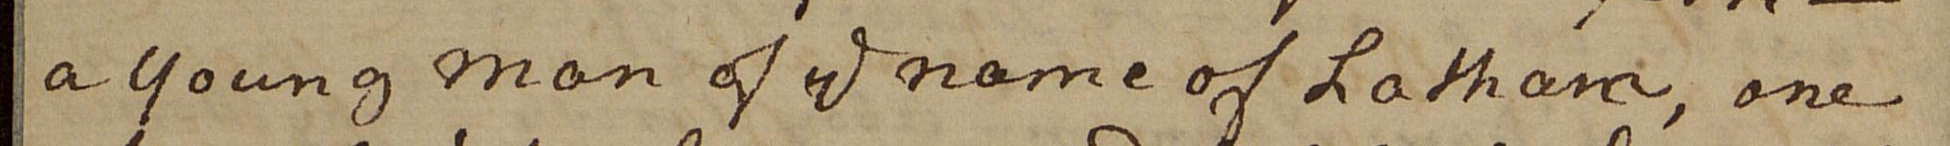a Young Man of y^e name of Lathan, one
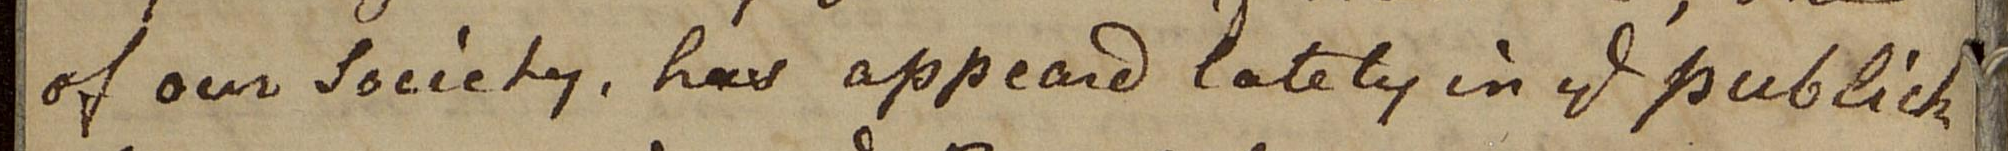of our Society. has appeard lately in y^e publick
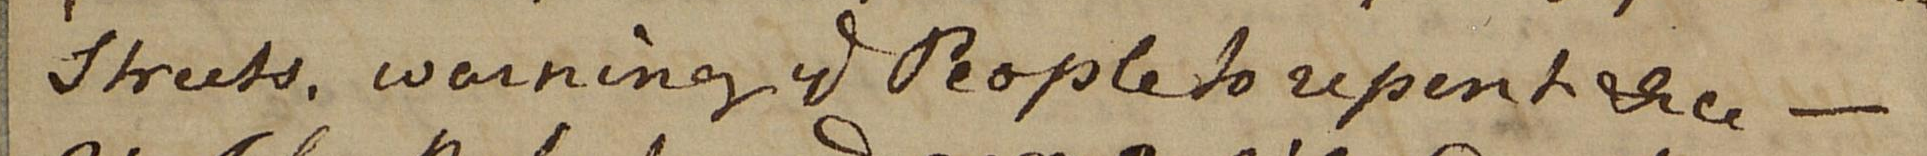Streets, warning y^e People to repent &c-
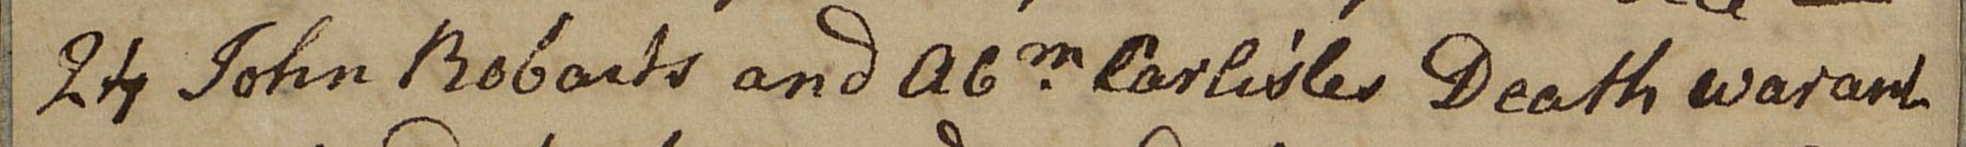24 John Robarts and Ab^m. Carlisles Death warant
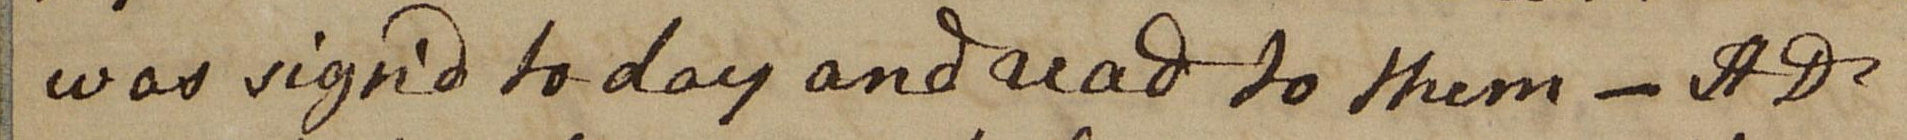was sign'd to day and read to them- H D
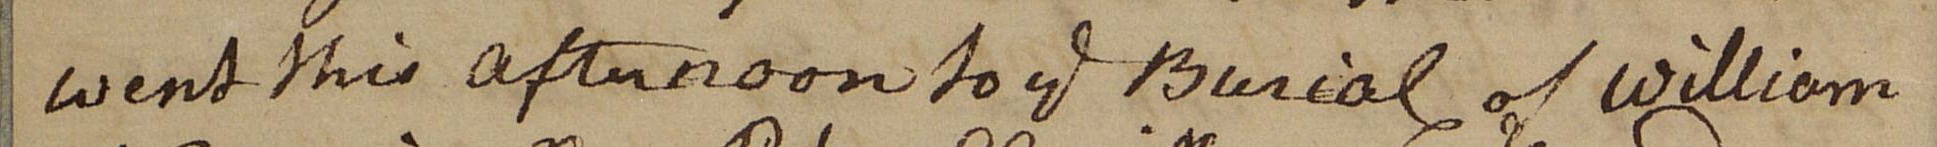went this afternoon to y^e Burial of William
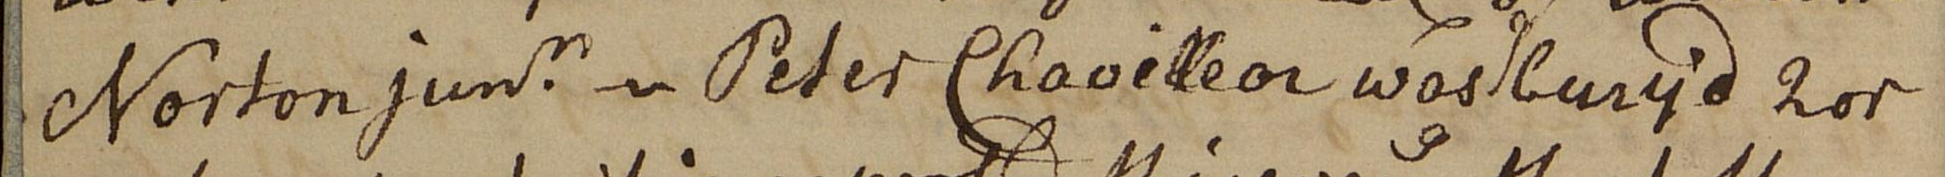Norton jun^r.- Peter Chavilleor was bury'd 2 or
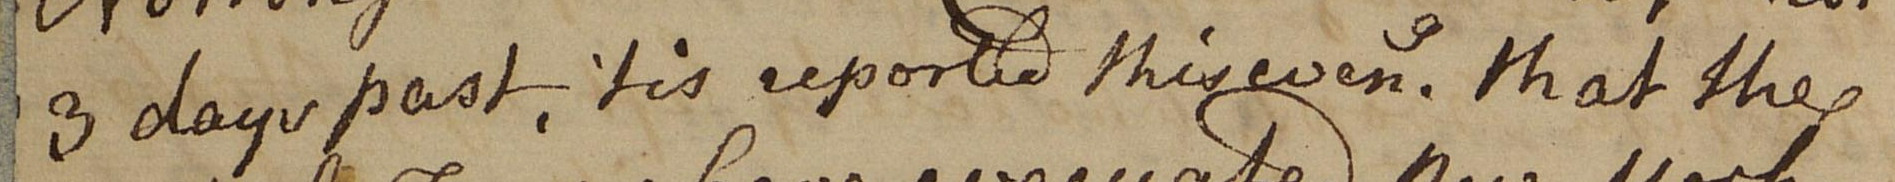3 days past, 'tis reported this even^g. that the
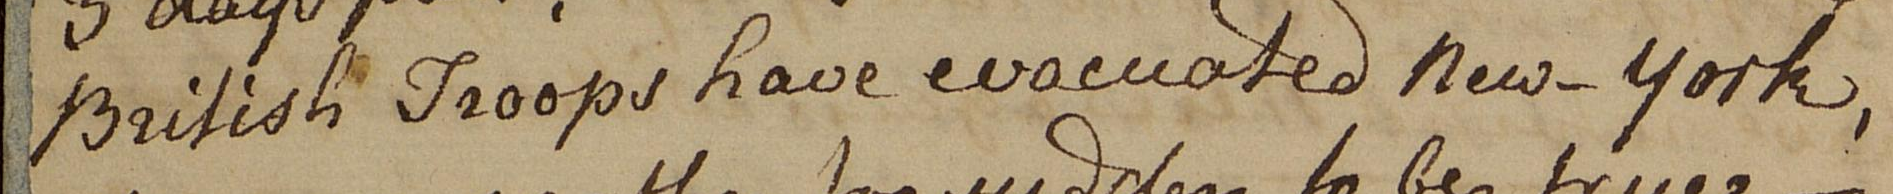British Troops have evacuated New- York,
